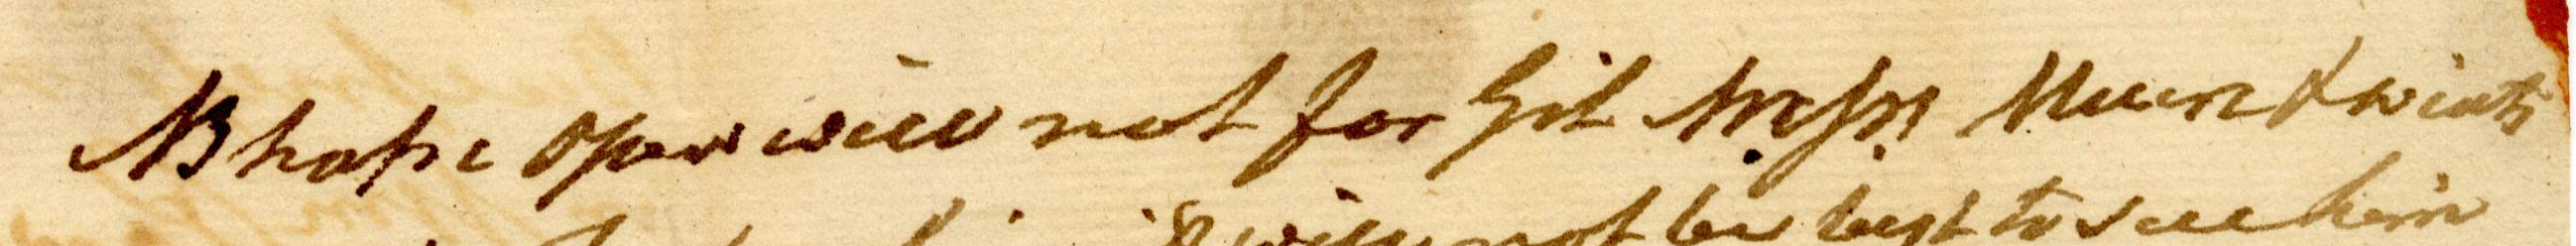NB hope you will not for git Messrs Mecer & wints
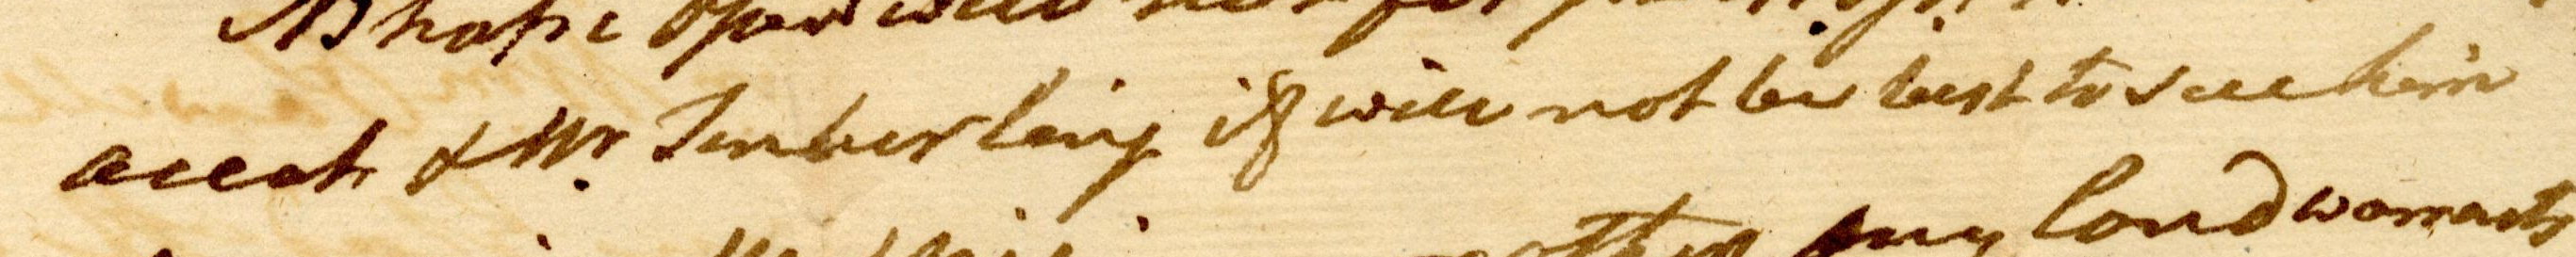accot & M^r Tenberling if will not be best to see him
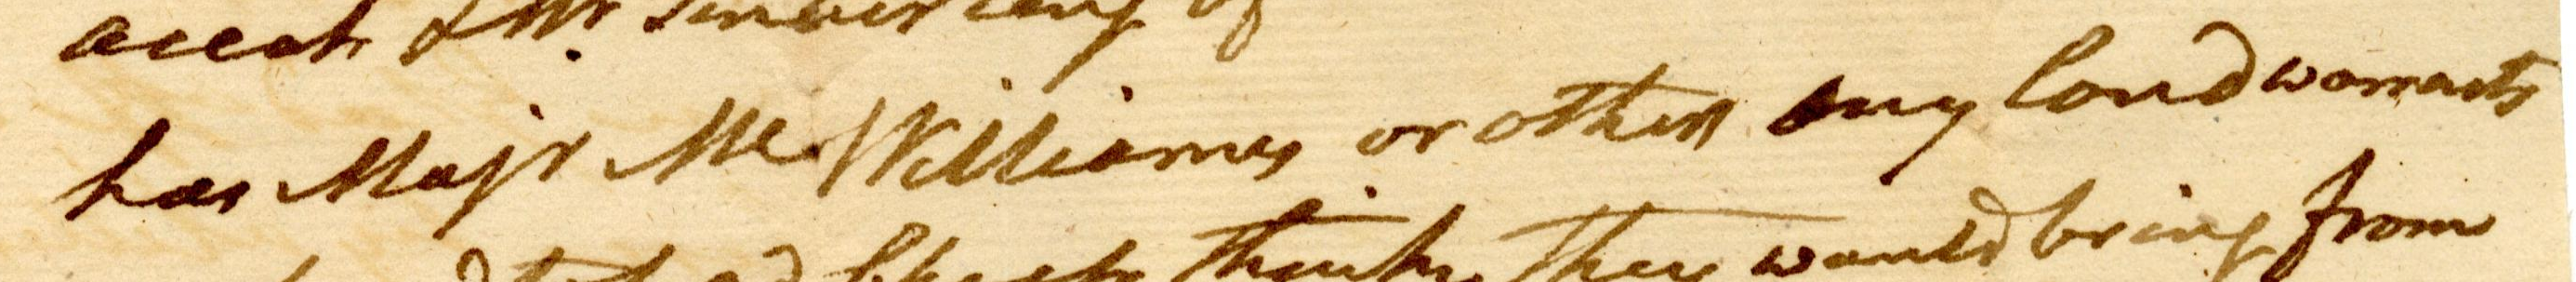has Maj^r M^l Williams or others any land warrants
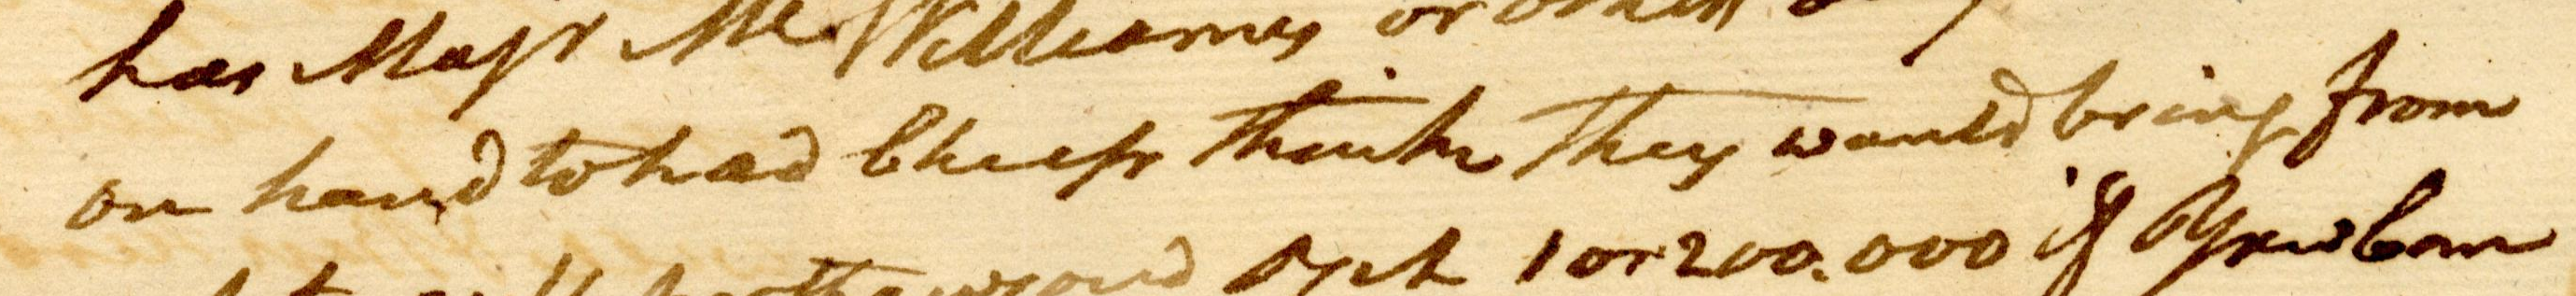on hand to had cheap think they would bring from
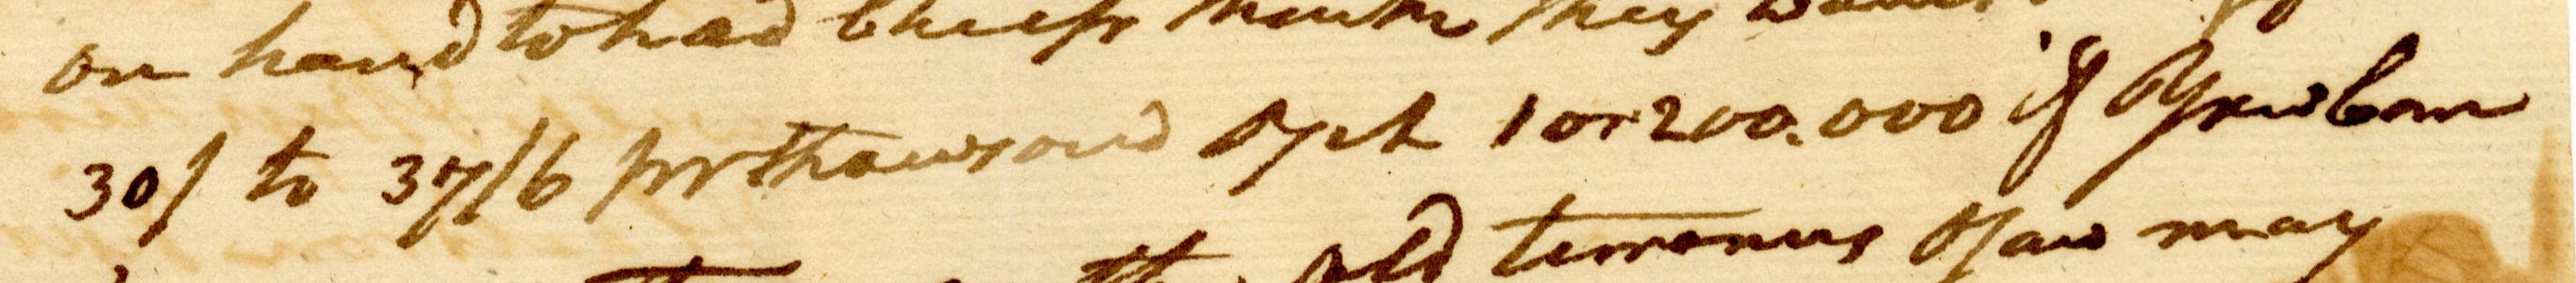30s to 37s6 pr thousand yet 1 or 200.000 if you can
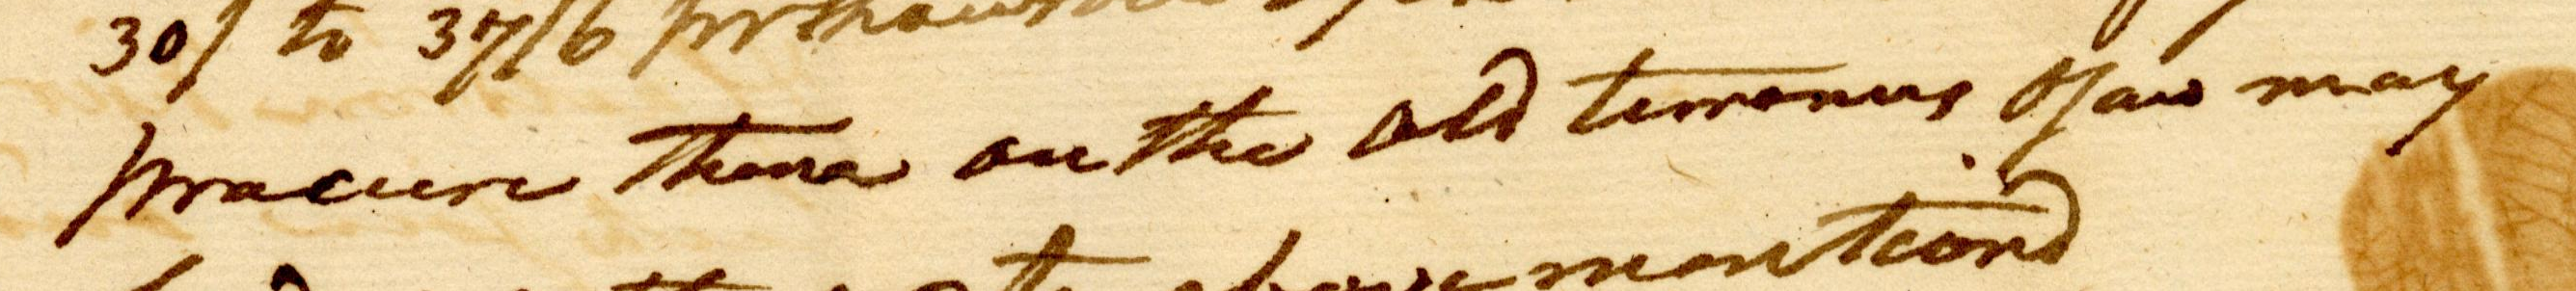procure them on the old terrems you may
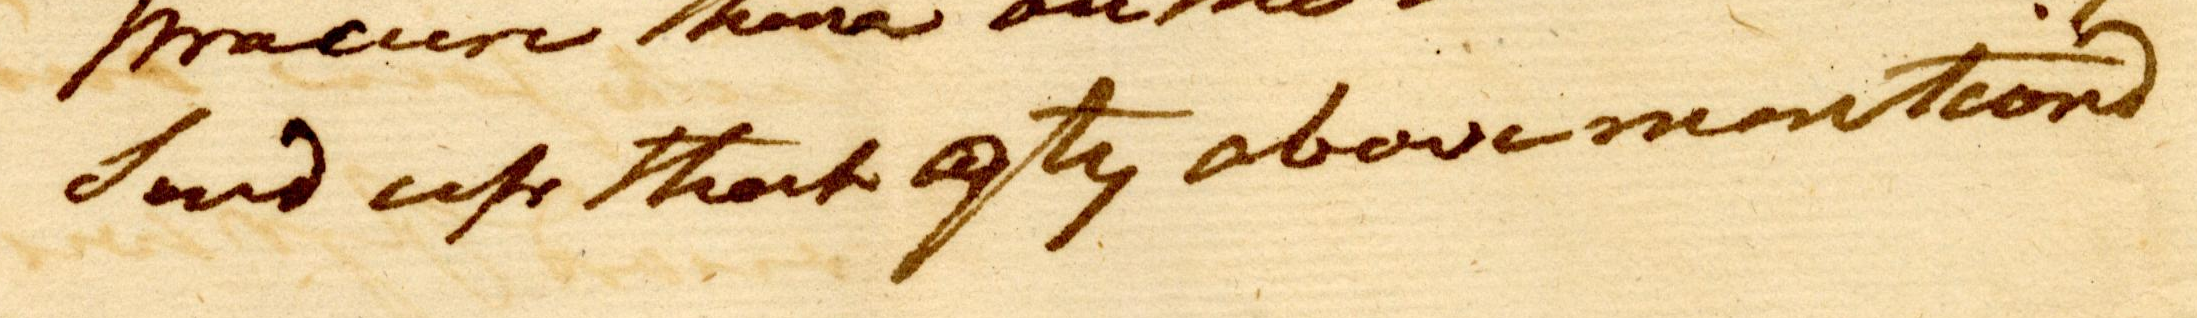send up that qty above mentiond
